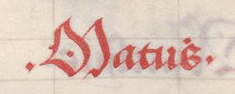.Matuṡ.
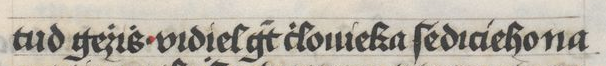tud geżiṡ. vidiel ḡt ċlouieka ſedicíeho na
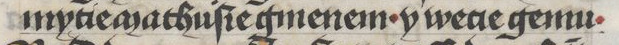mytie mathuẛie gmenem.y wecie gemu.
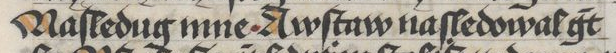Naſledug mne.A wſtaw naſledowal ḡt
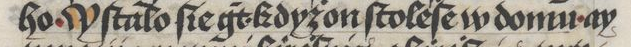ho.Y ſtalo ſie ḡt. kdyż on ſtoleẛe w domu.ay
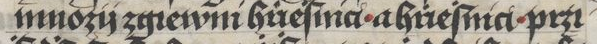mnozij zgiewni hṙieẛníci.ahṙieẛníci.przi¬
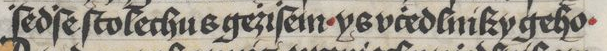ẛedẛe ſtolechu s geżiẛem.y s vċedlníky geho.
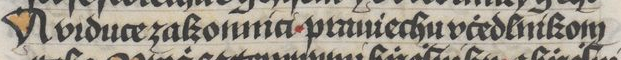A viduce zakonníci.prauiechu vċedlnikom
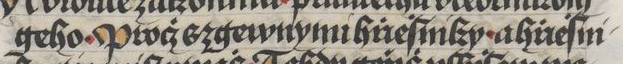geho.Procż s zgewnymi hṙieẛníky.a hṙieẛní¬
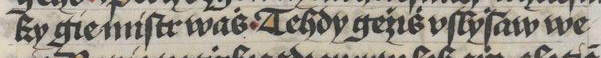ky gíe míſtr waṡ.Tehdy geżiṡ vſlyẛaw we¬
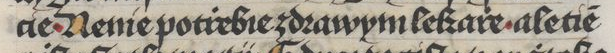cie.Neníe potṙebie zdrawym lekaṙe.ale tiē
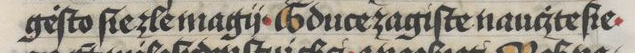geẛto ſie zle magij.Gduce zagiſte naucżte ſie.
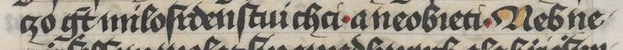czo ḡt miloſrdenſtui chci.a neobieti.Neb ne¬
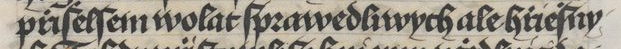pṙiẛ̄el ſem wolat ſprawedliwych ale hṙieẛny¬
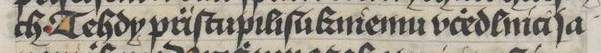ch.Tehdy pṙiſtupili ſu kniemu včedlníci Ia¬
